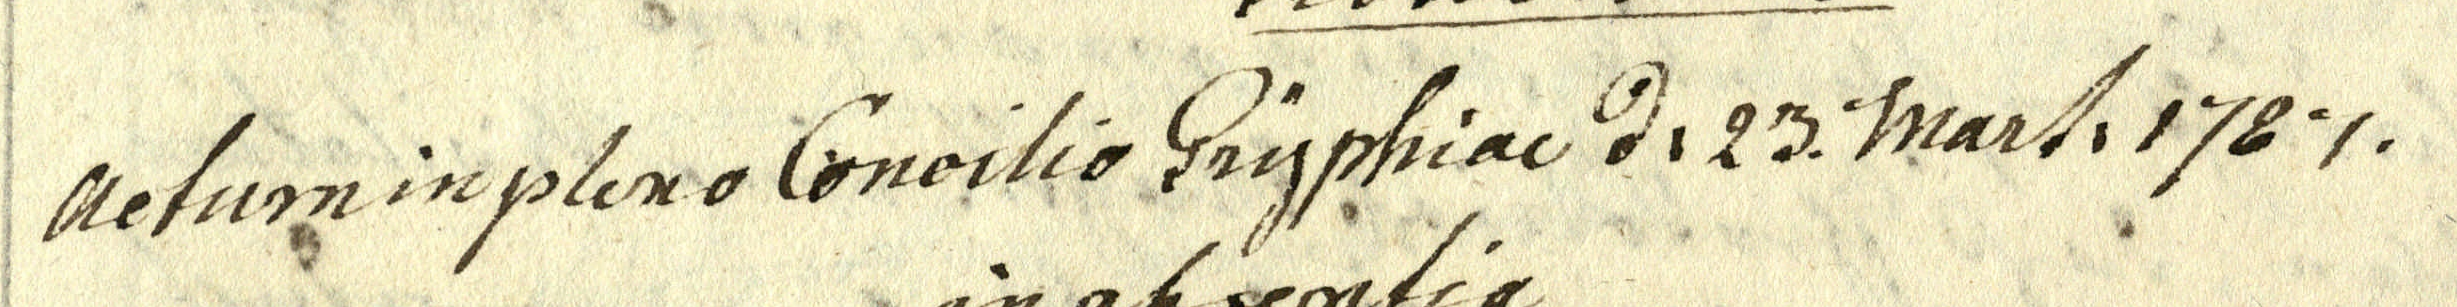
Actum in pleno Concilio Grÿphiae d. 23. Mart. 1787.
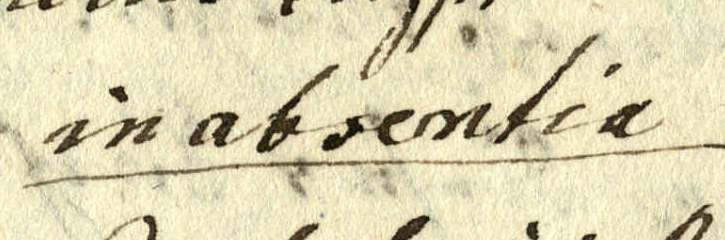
in absentia
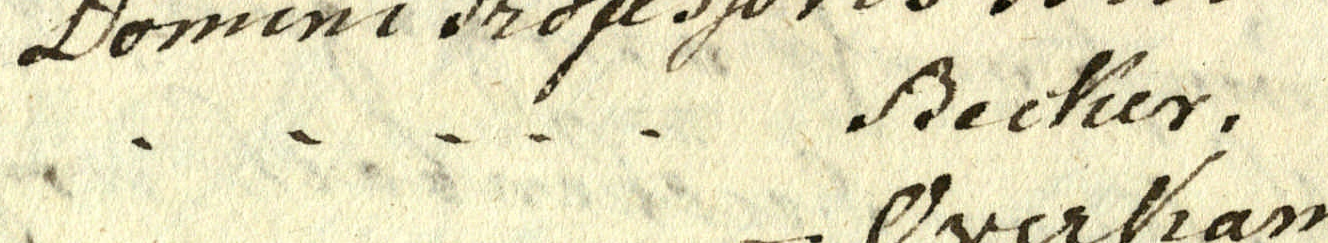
Becker
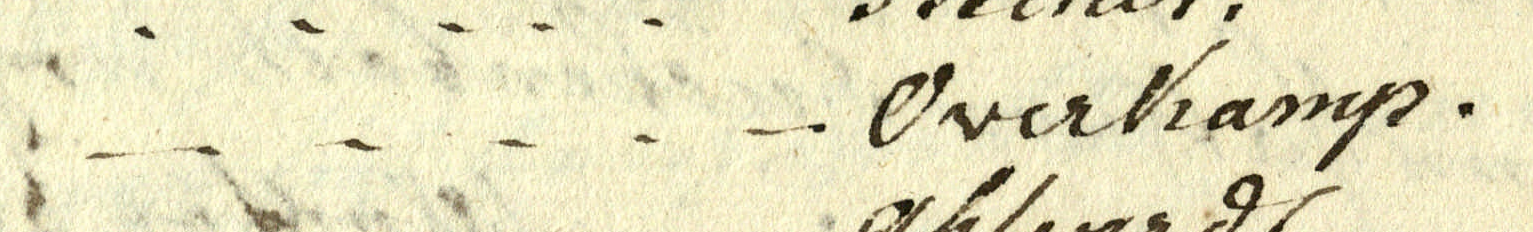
Overkamp.
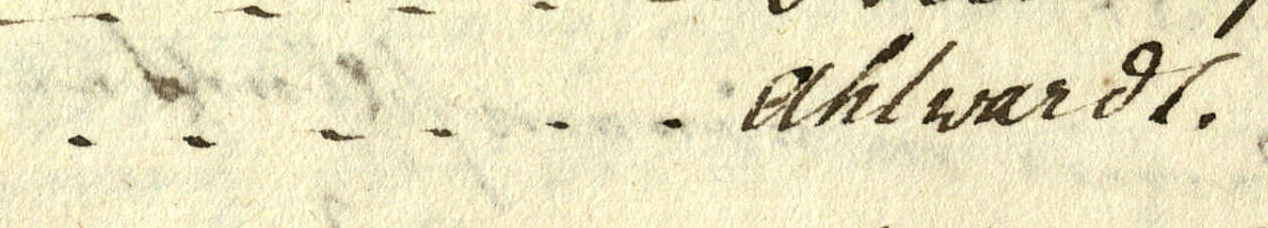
Ahlwardt.
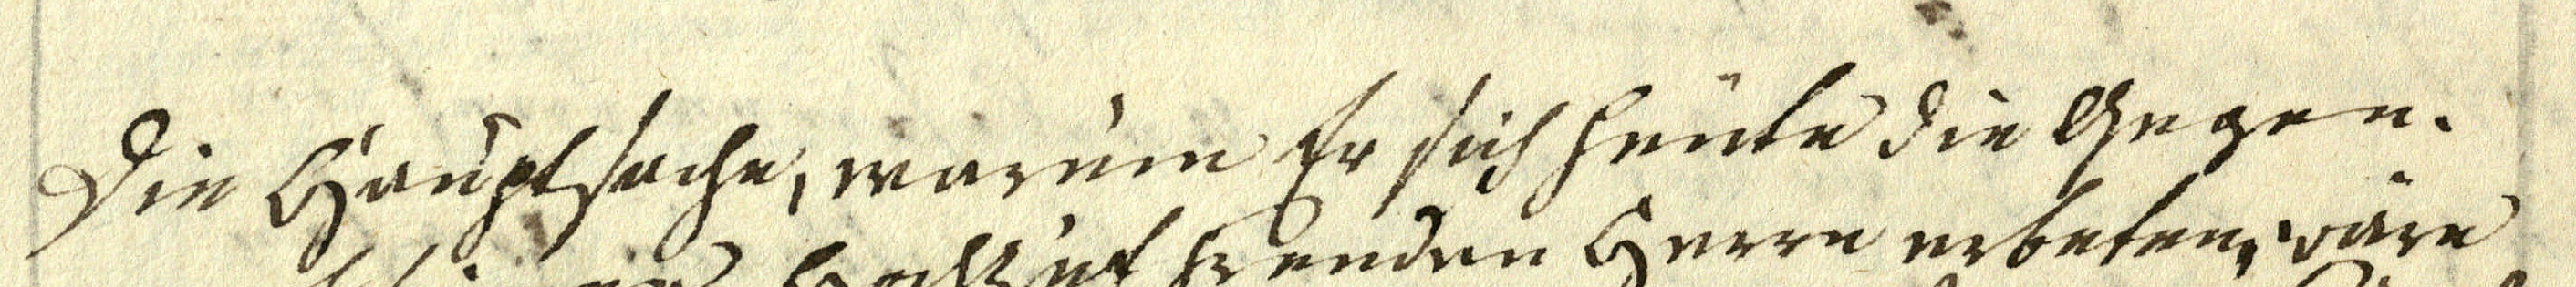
Die Hauptsache, warum Er sich heute die Gegen¬
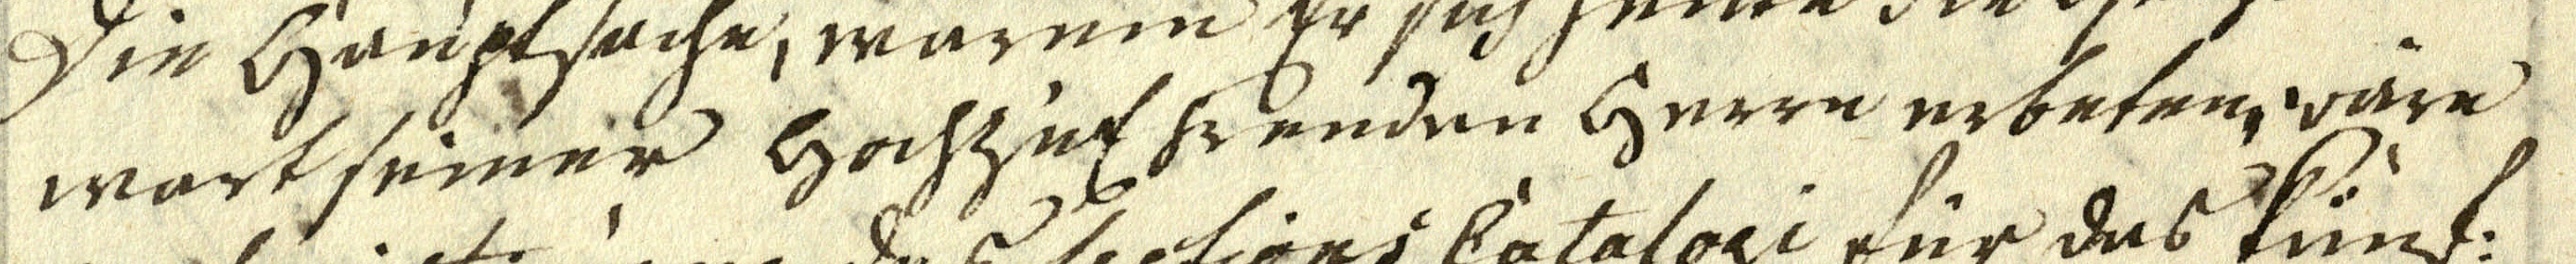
wart seiner HochzuEhrenden Herrn erbeten, wäre
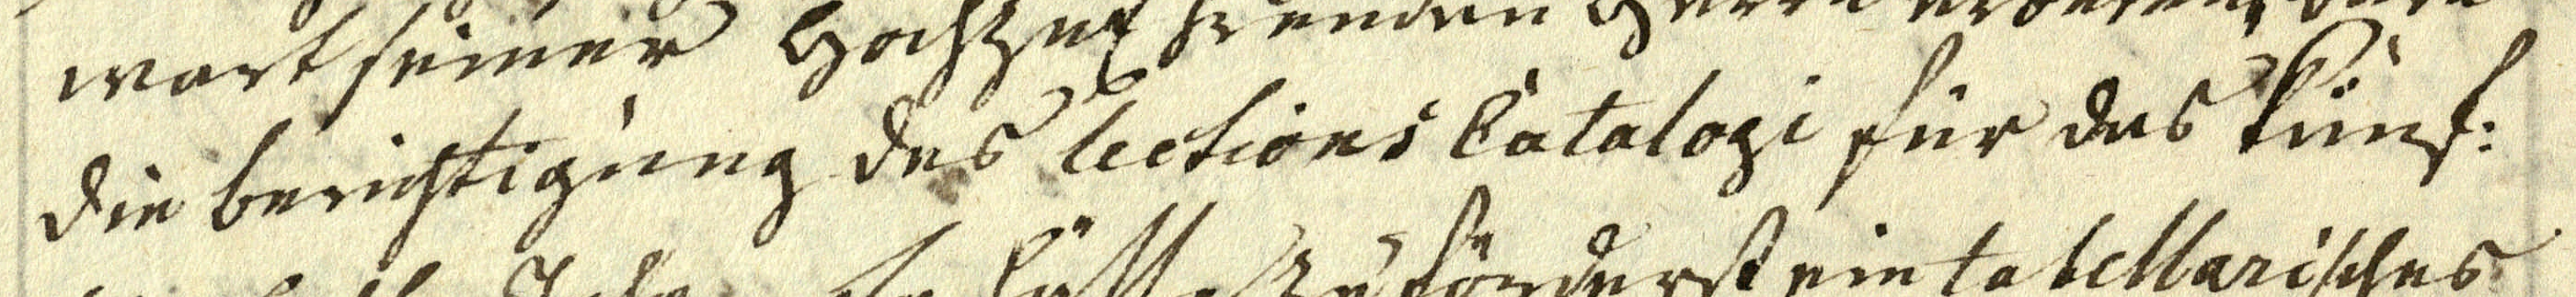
die Berichtigung des Lections Catalogi für das künf¬
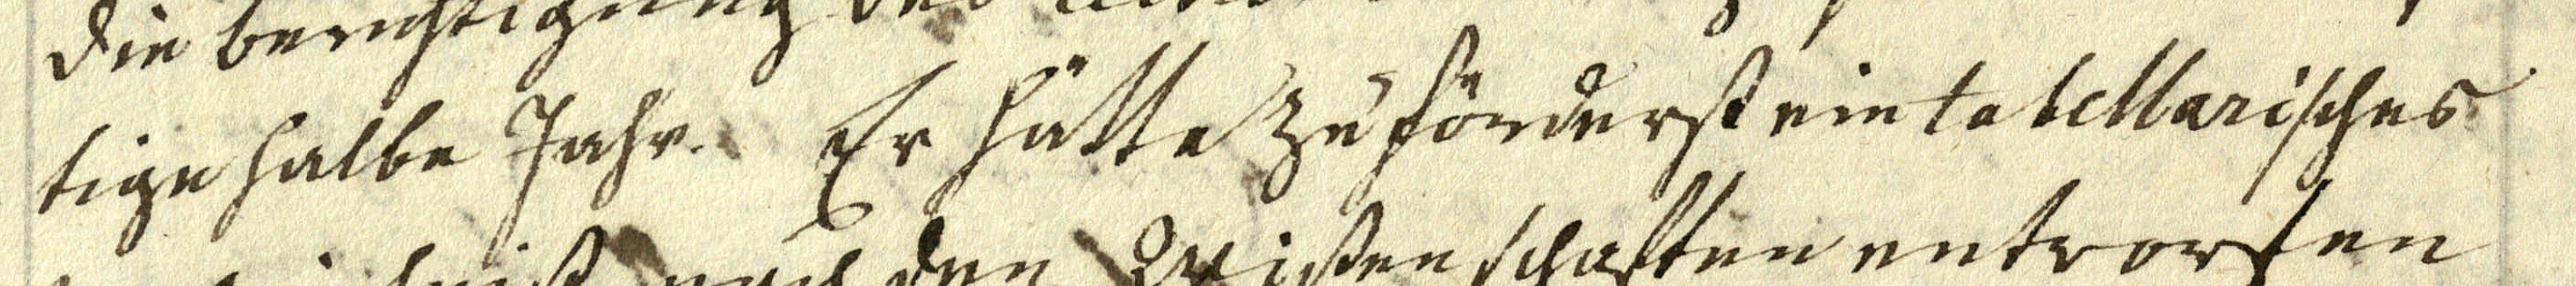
tige halbe Jahr. Er hätte zuförderst ein tabellarisches
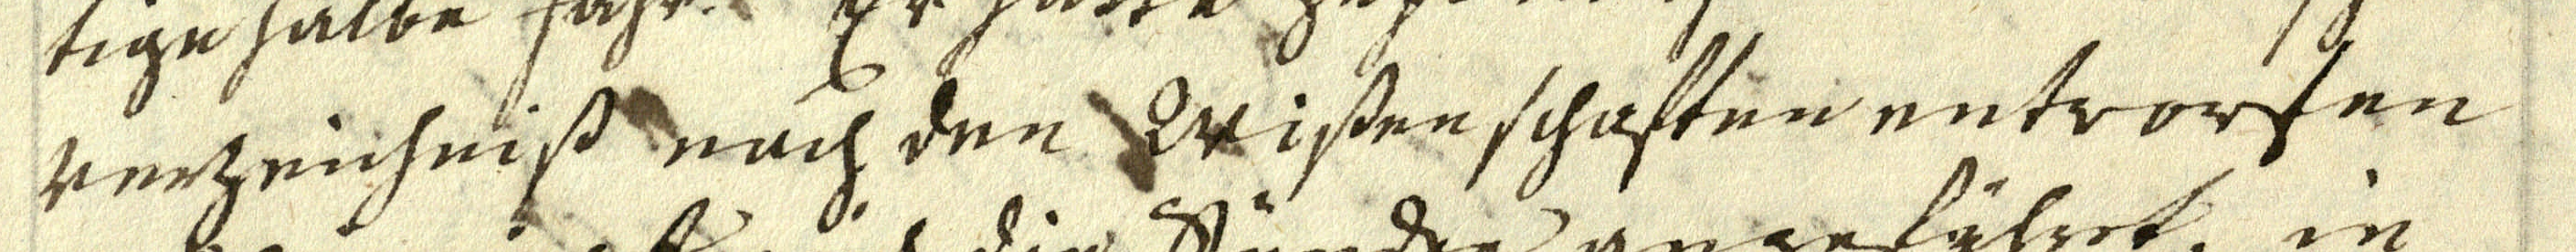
Verzeichniß nach den Wißenschaften entworfen
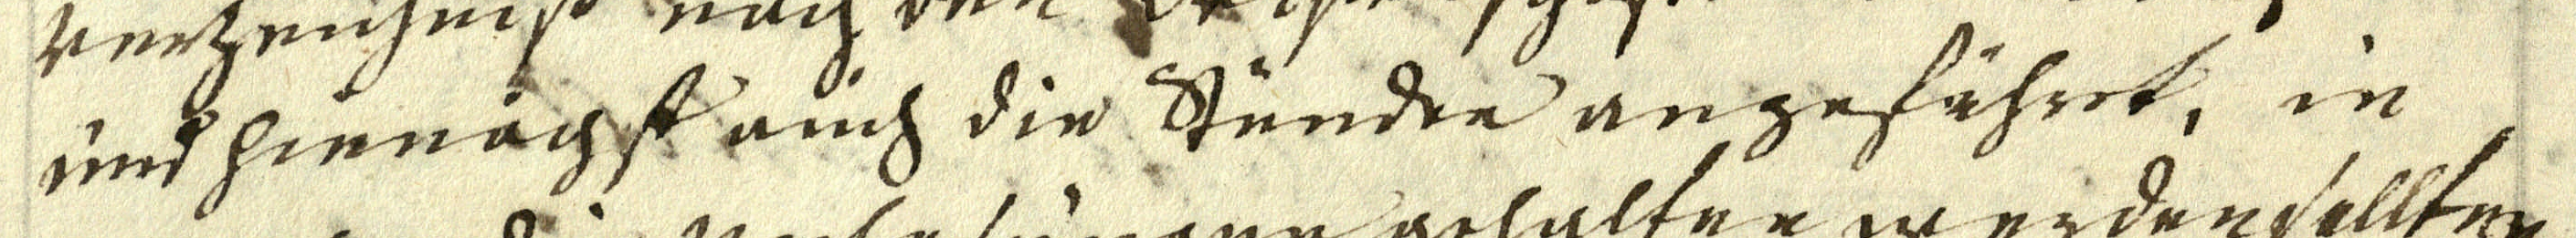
und hienächst auch die Stunden angeführet, in
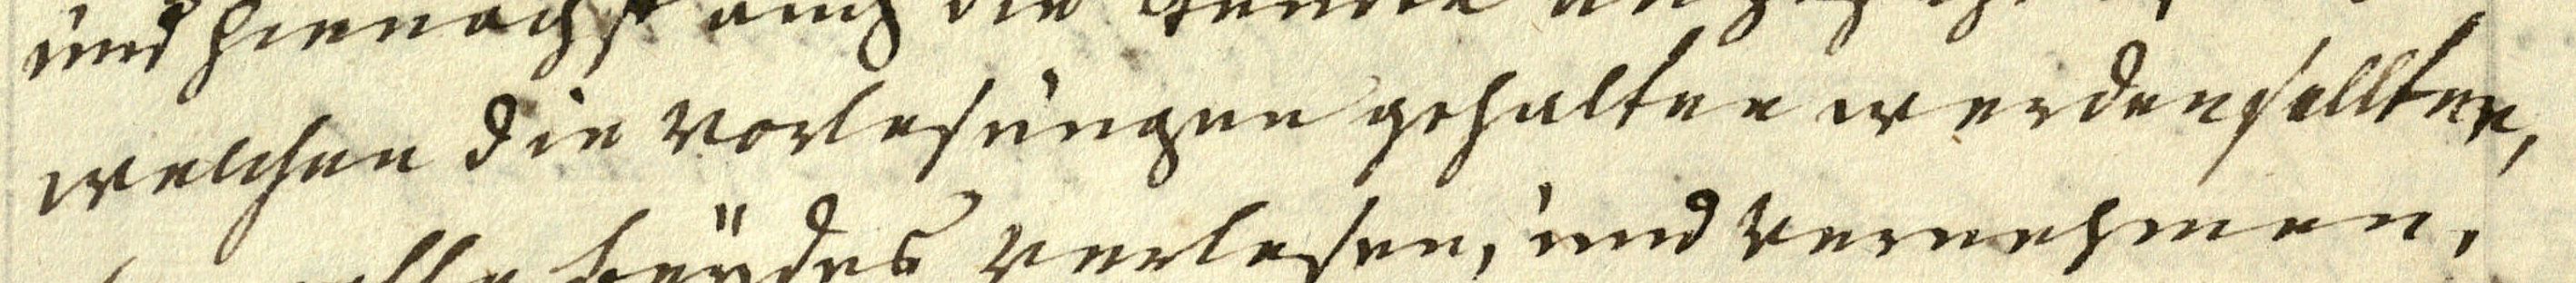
welchen die Vorlesungen gehalten werden sollten,
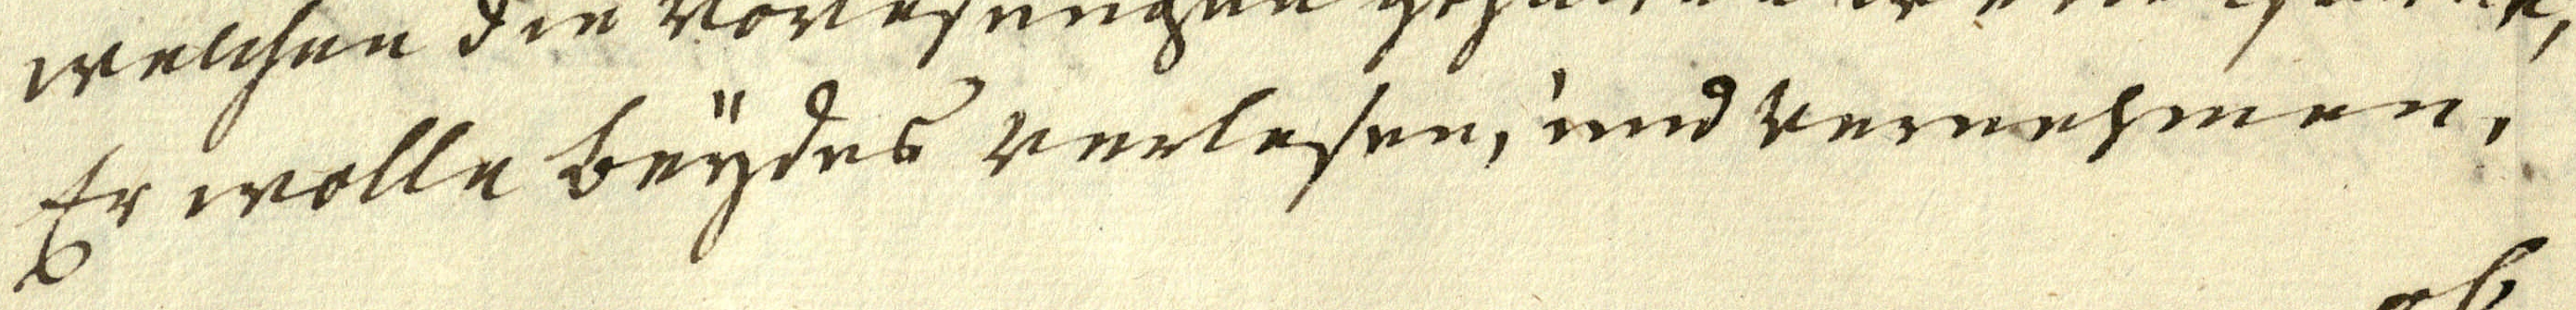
Er wolle beÿdes verlesen, und vernehmen,
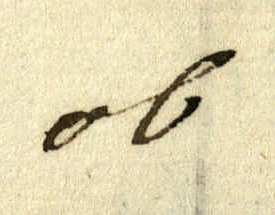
ob
